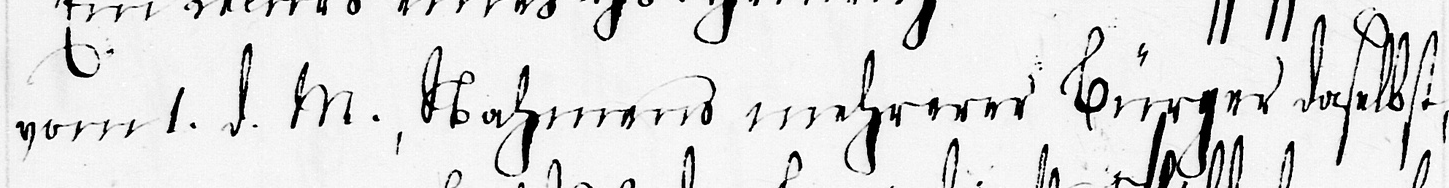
vom 1. d. M., Nahmens mehrerer Bürger daselbs¬
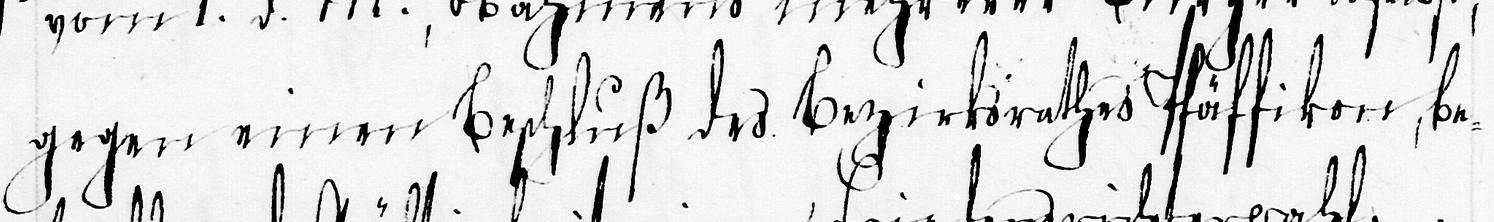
gegen einen Beschluß des Bezirksrathes Pfäffikon, b¬
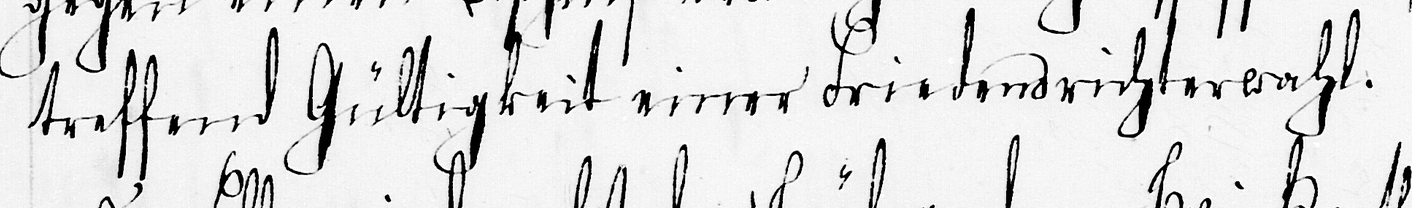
etreffend Gültigkeit einer Friedensrichterwahl.
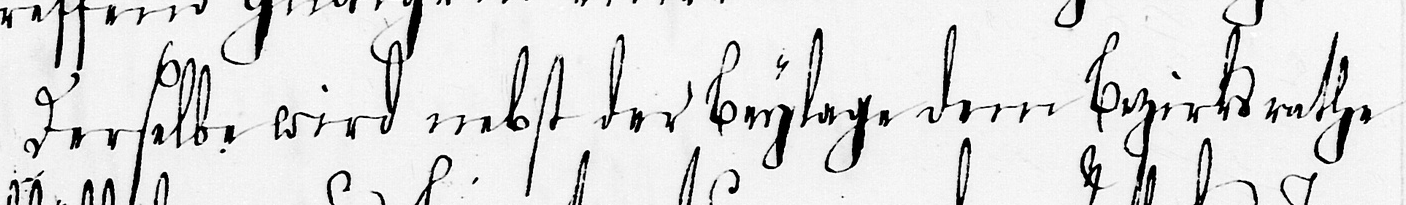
Derselbe wird nebst der Beylage dem Bezirksrathe
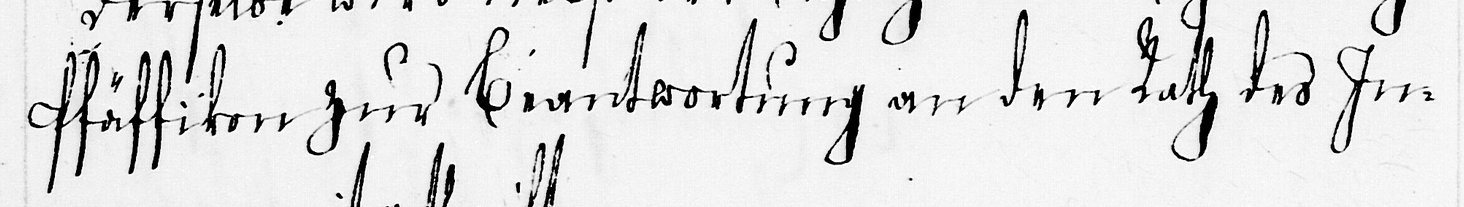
Pfäffikon zur Beantwortung an den Rath des In¬
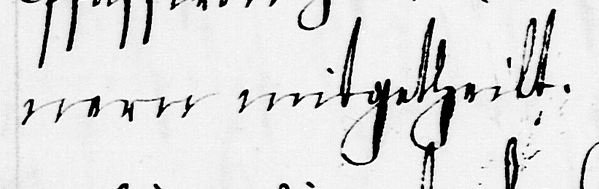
nern mitgetheilt.
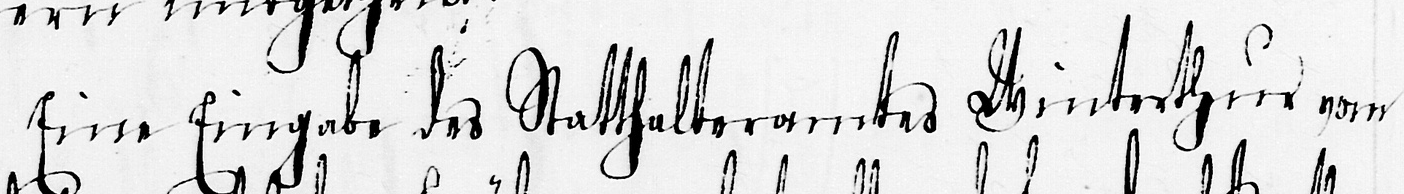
Eine Eingabe des Statthalteramtes Winterthur vom
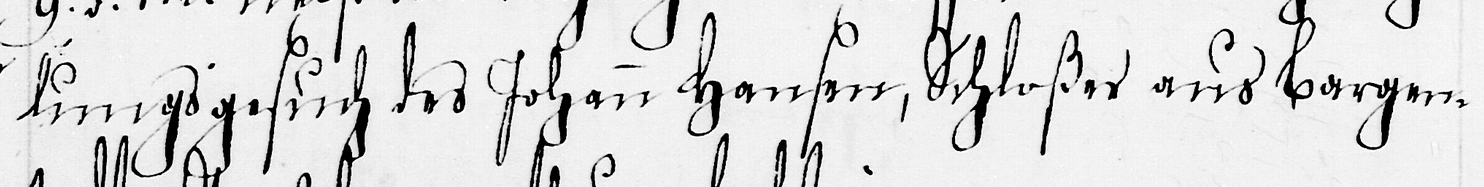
lungsgesuch des Johann Hausen, Schloßer aus Bargens¬
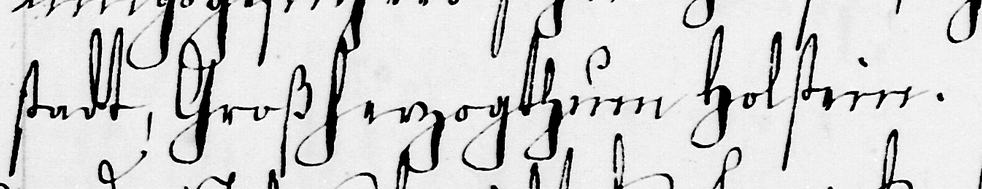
tadt, Großherzogthum Holstein.
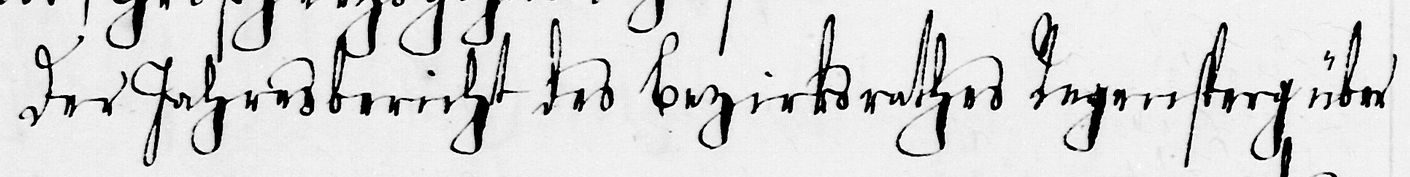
Der Jahresbericht des Bezirksrathes Regensperg über
